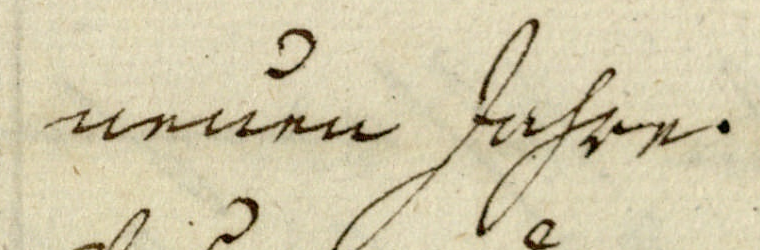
neuen Jahre.
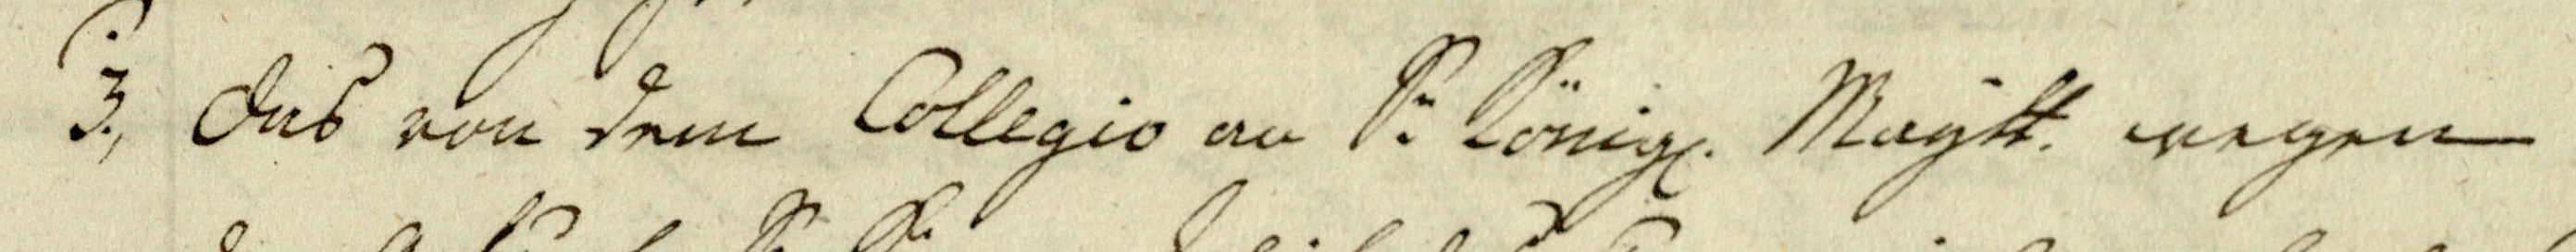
3., Das von dem Collegio an Sr. Königl. Maÿtt. wegen
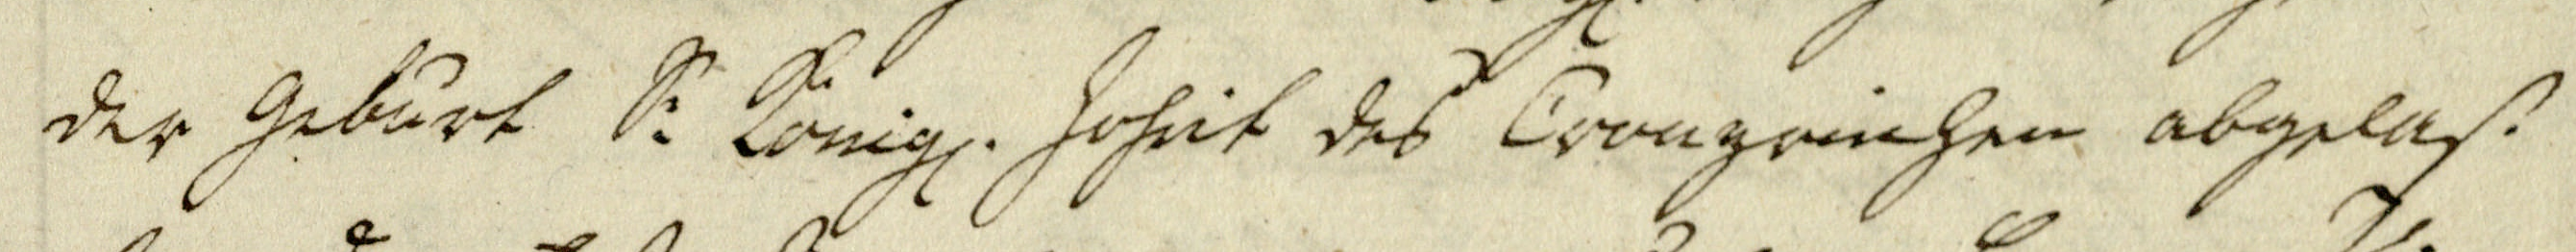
der Geburt Sr Königl. Hohit des Cronprinzen abgelas¬
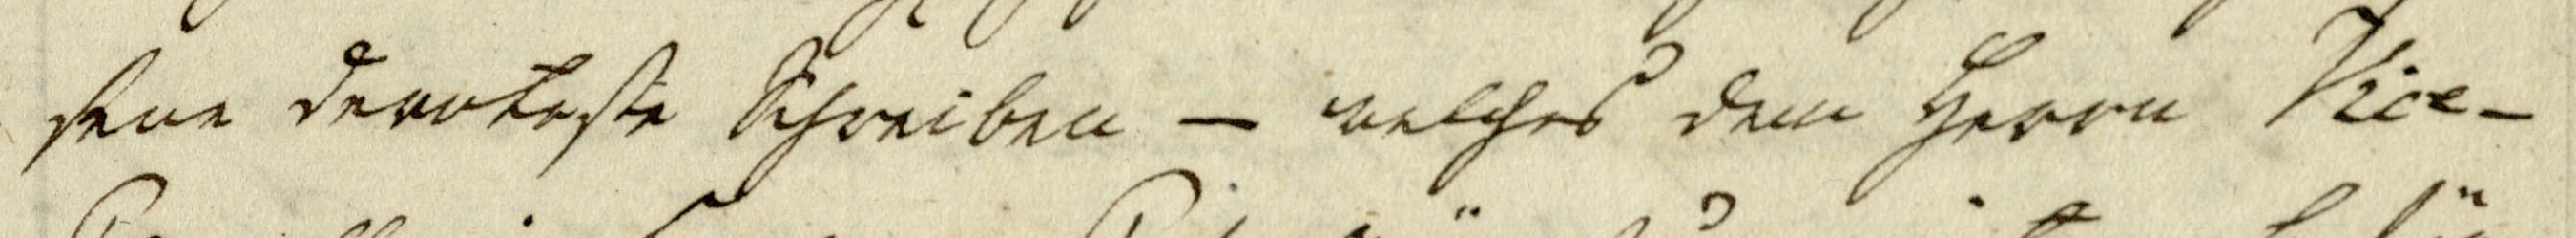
sene devoteste Schreiben welches dem Herrn Vice¬
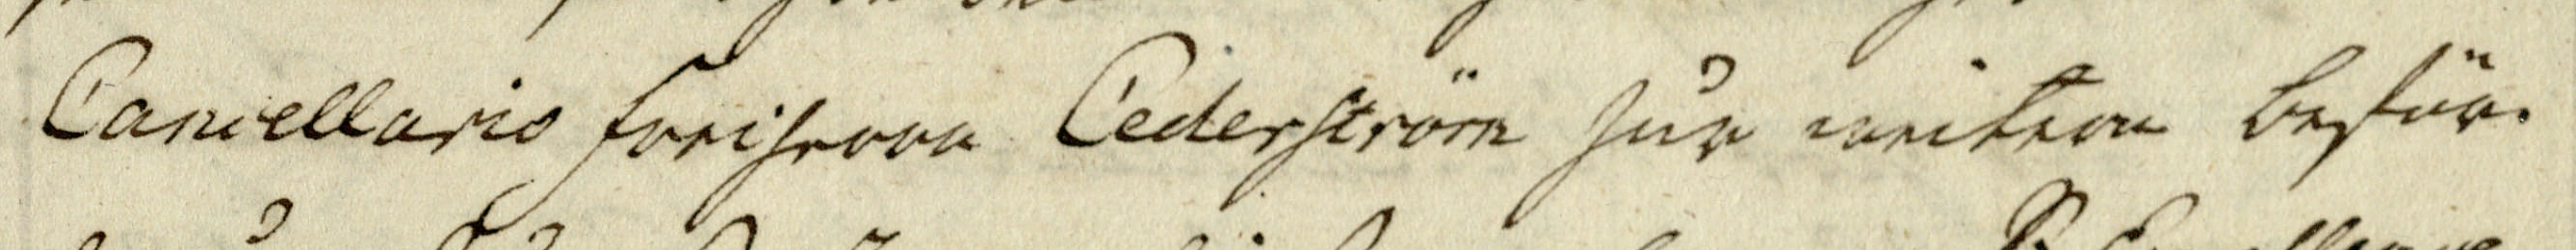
Cancellario Freiherrn Cederström zur weitern Beför¬
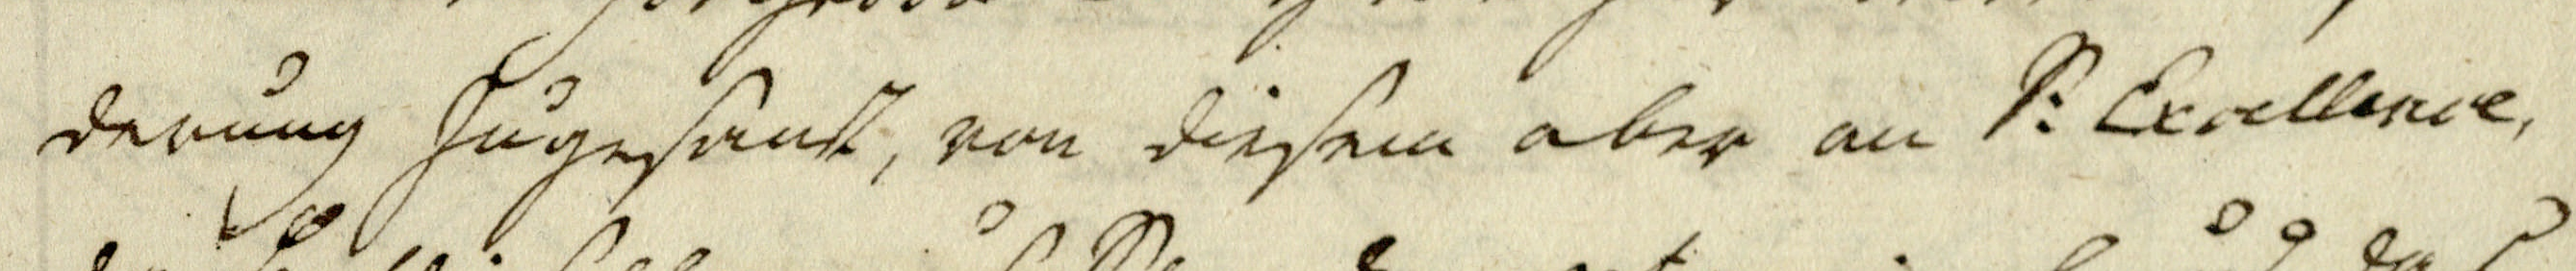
derung zugesandt, von diesem aber an Sr Excellence,
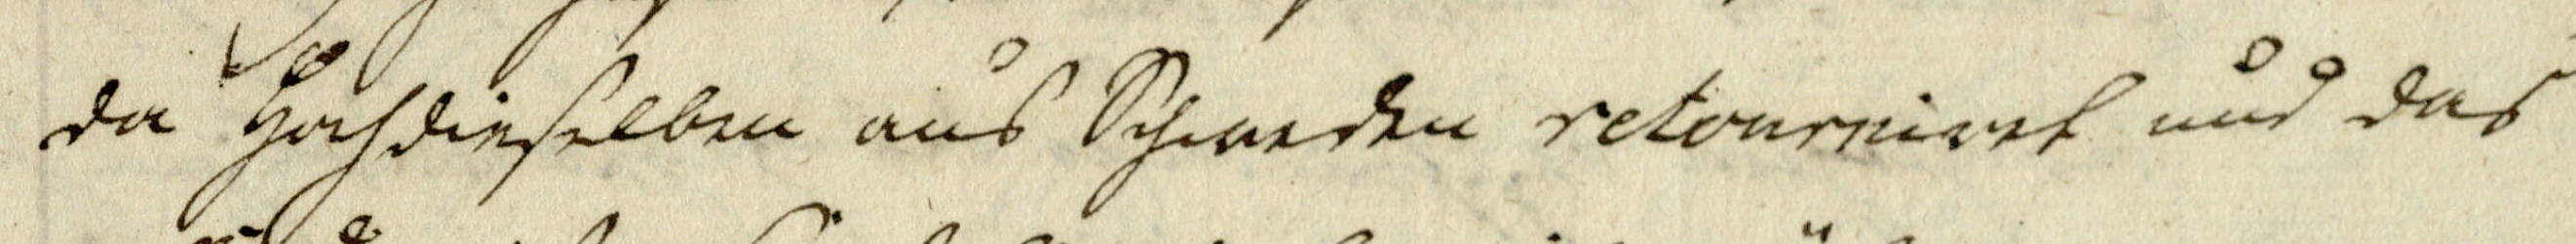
da Hochdieselben aus Schweden retourniret und das
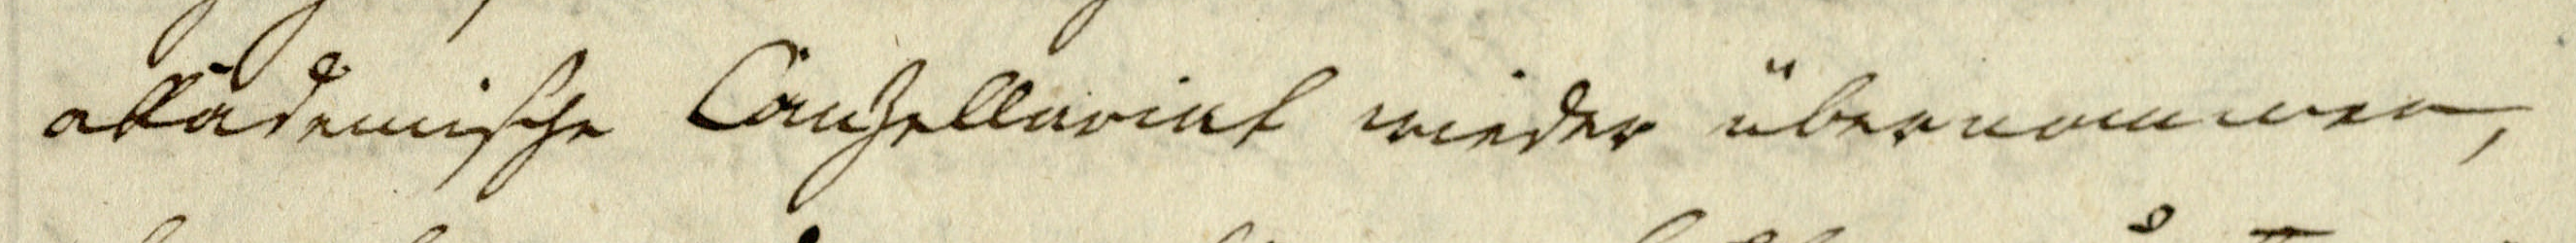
akademische Canzellariat wieder übernommen,
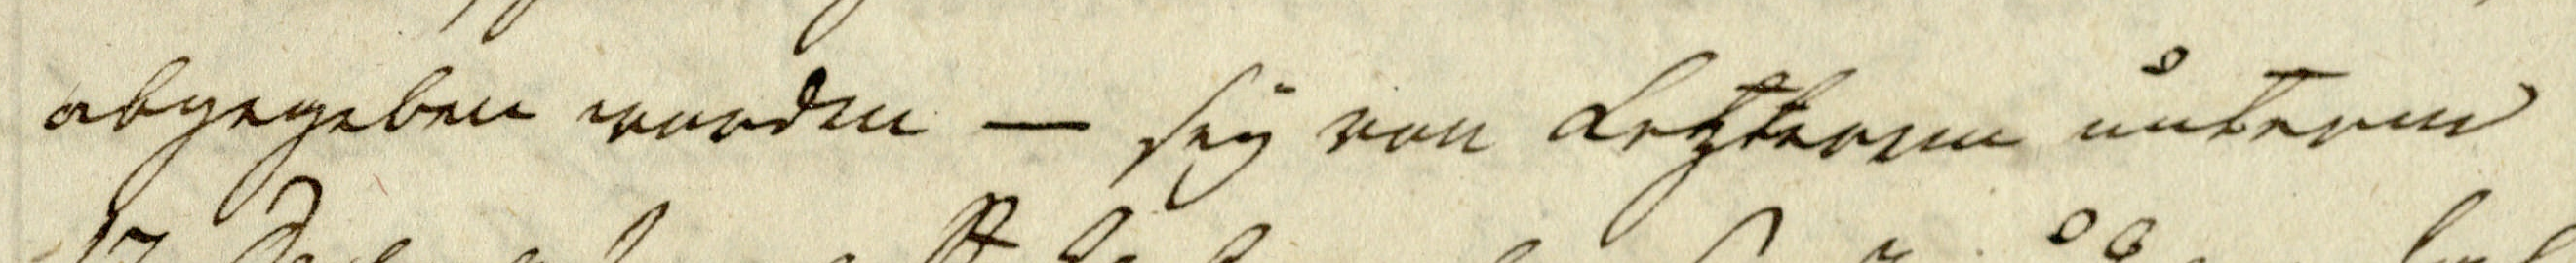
abgegeben worden seÿ von Letzteren unterm
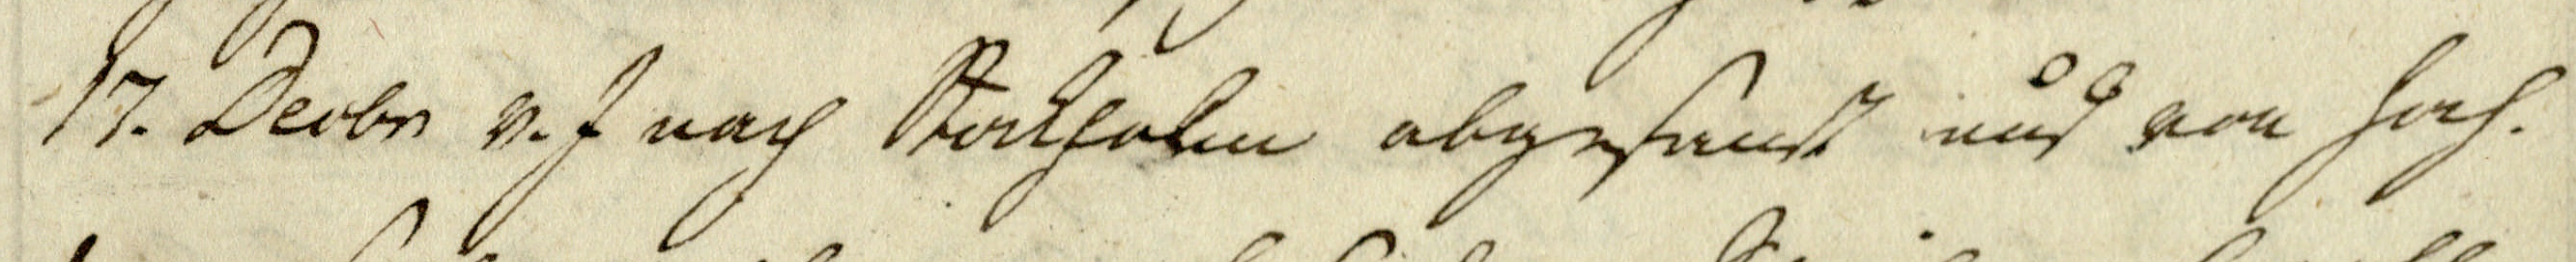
17. Decbr. v. J. nach Stockholm abgesandt und von Hoch¬
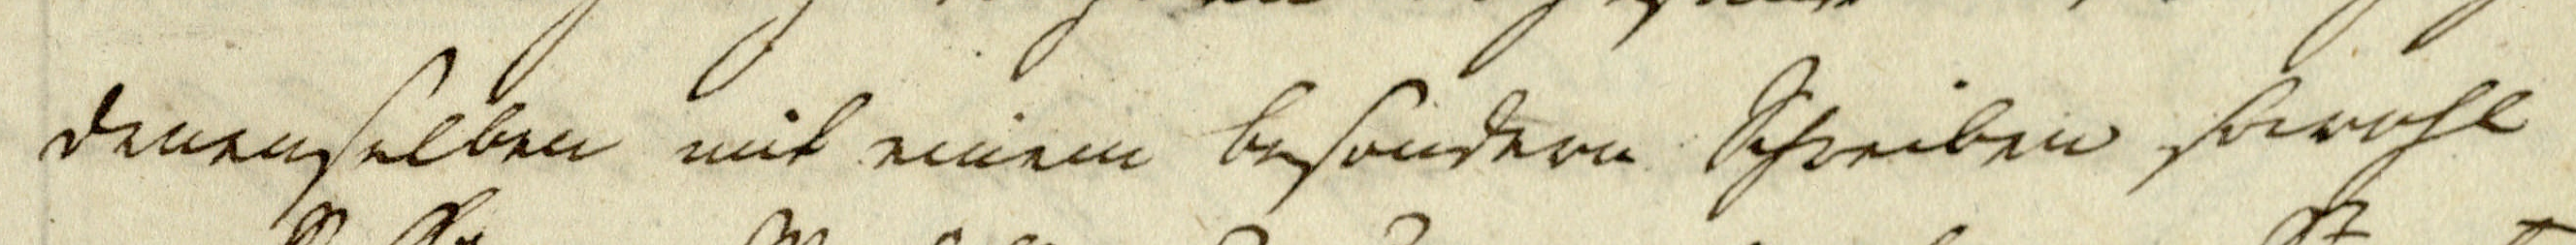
denenselben mit einem besondern Schreiben sowohl
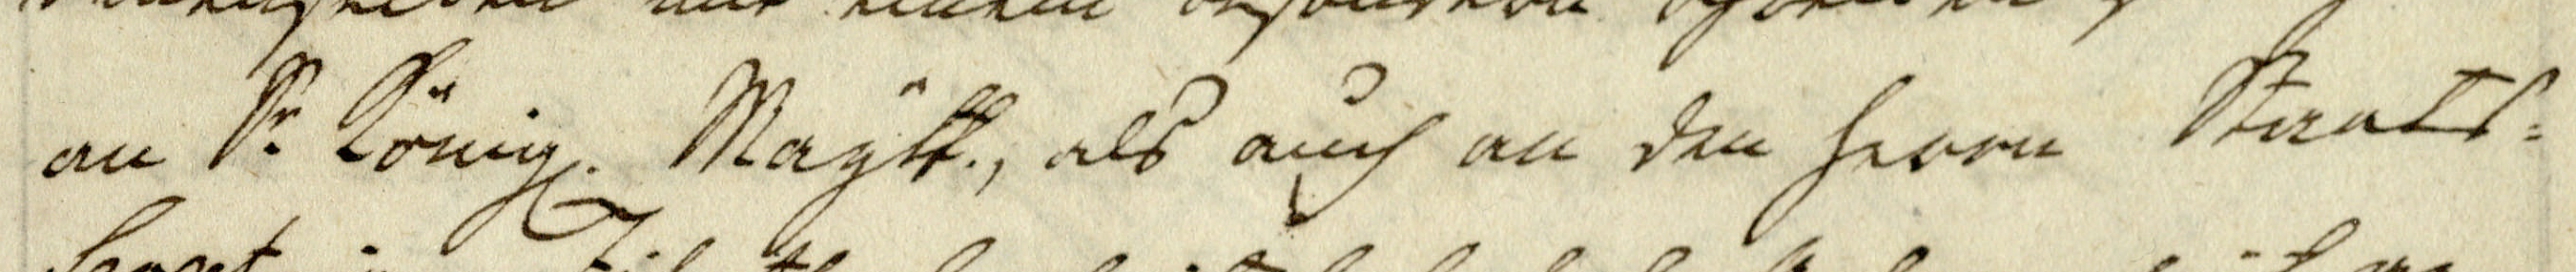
an Sr. Königl. Maÿtt., als auch an den Herrn Staats¬
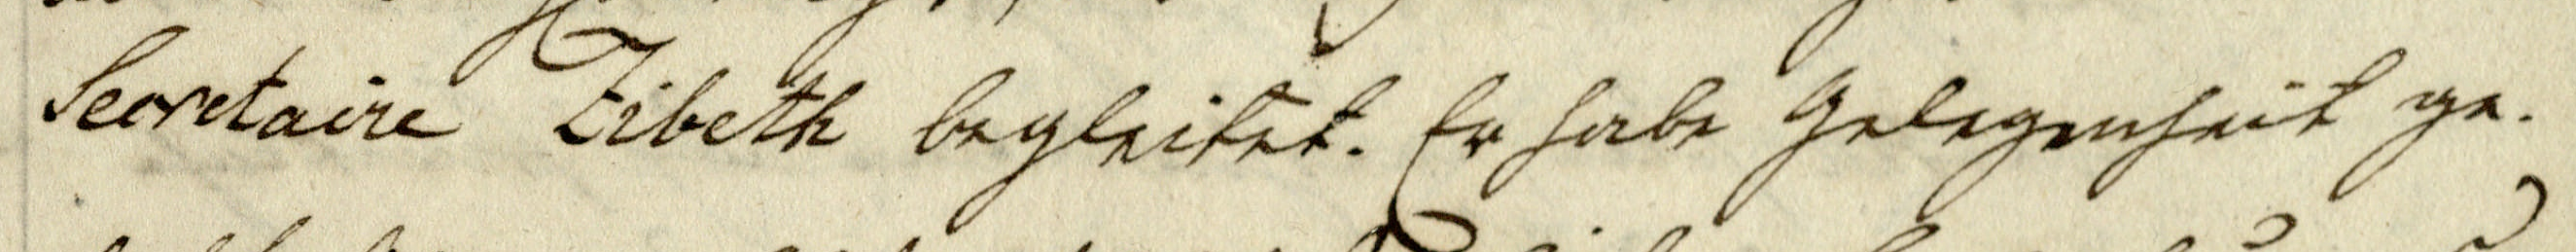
Secretaire Zibeth begleitet. Er habe Gelegenheit ge¬
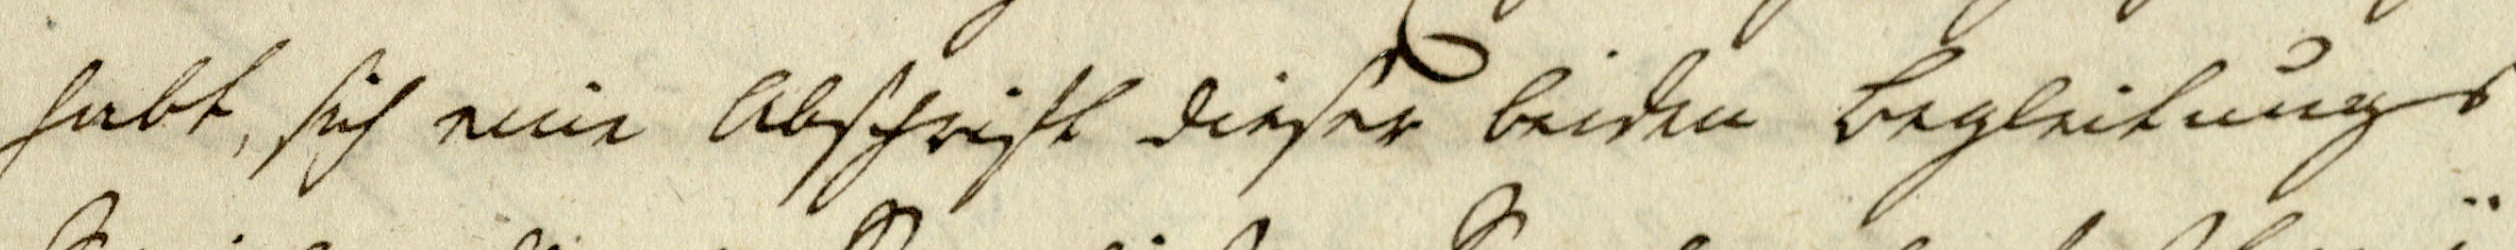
habt, sich eine Abschrift dieser beiden Begleitungs
